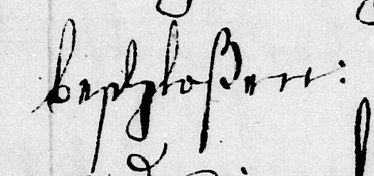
beschloßen:
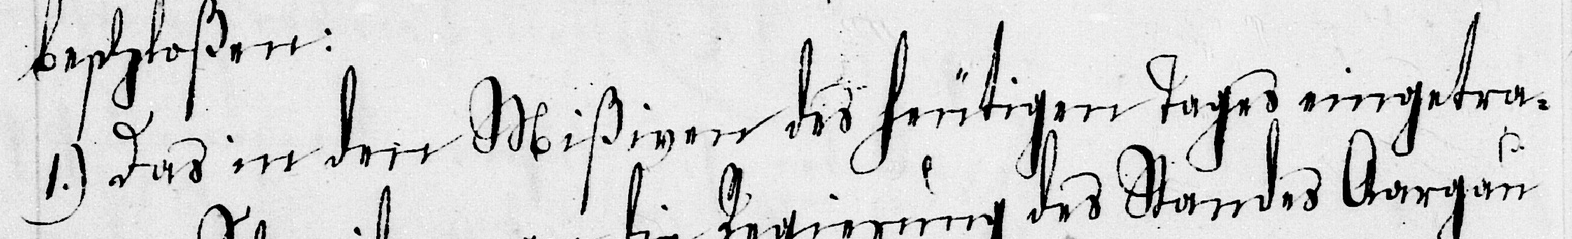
1.) Das in den Mißiven des heutigen Tages eingetra¬
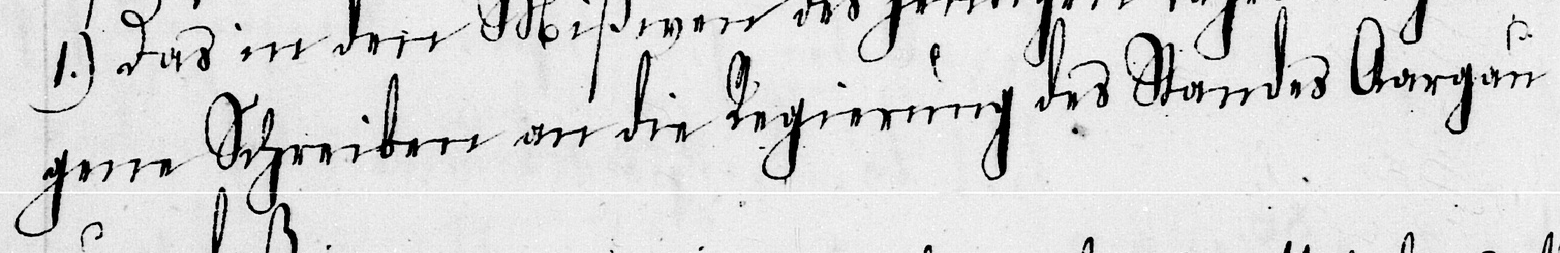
gene Schreiben an die Regierung des Standes Aargau
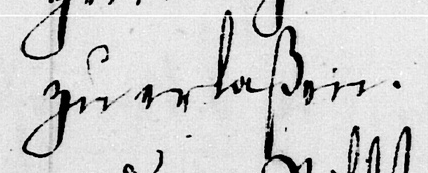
zu erlaßen.
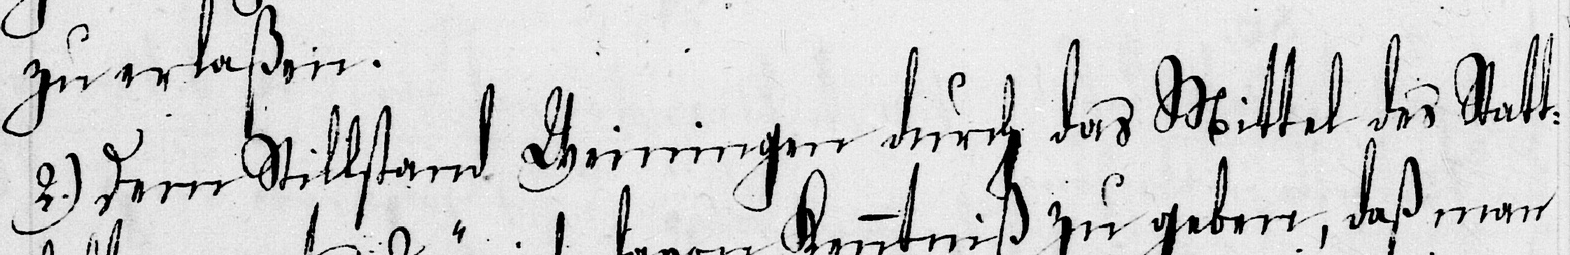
2.) Dem Stillstand Weiningen durch das Mittel des Stat¬
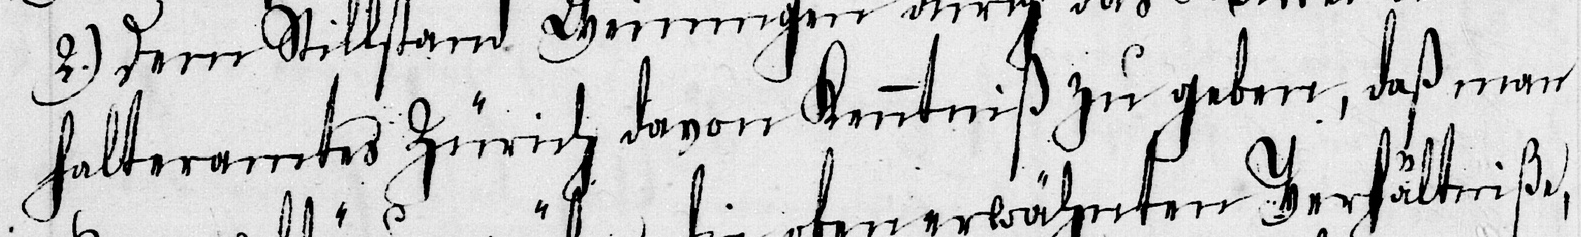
thalteramtes Zürich davon Kenntniß zu geben, daß man
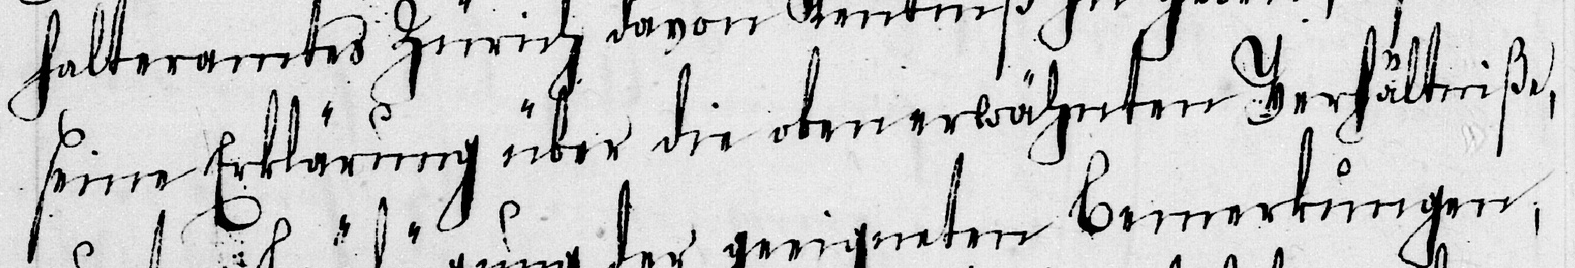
seine Erklärung über die oben erwähnten Verhältniße,
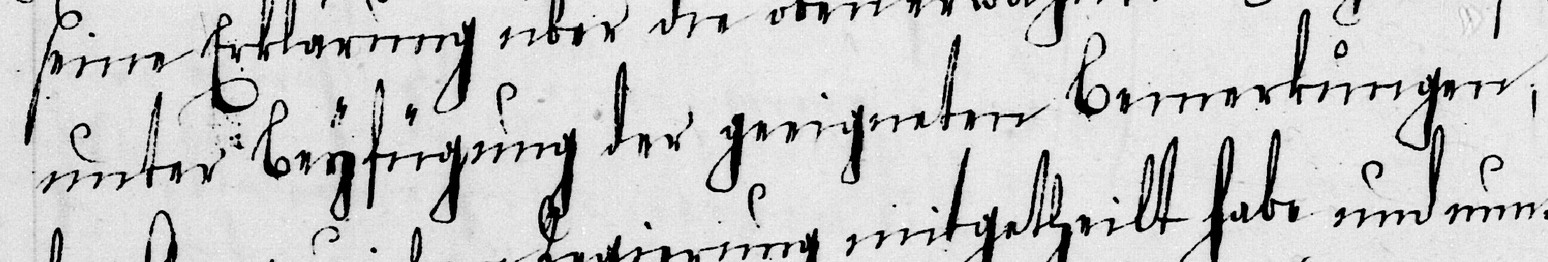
unter Beyfügung der geeigneten Bemerkungen,
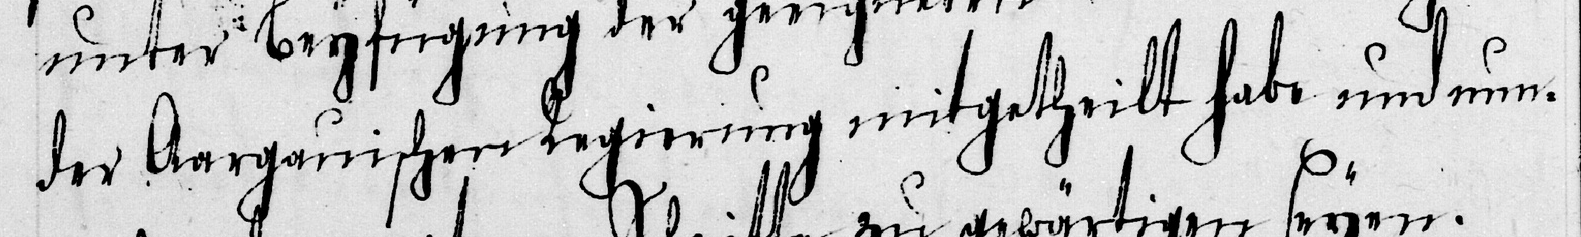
der Aargauischen Regierung mitgetheilt habe und nun¬
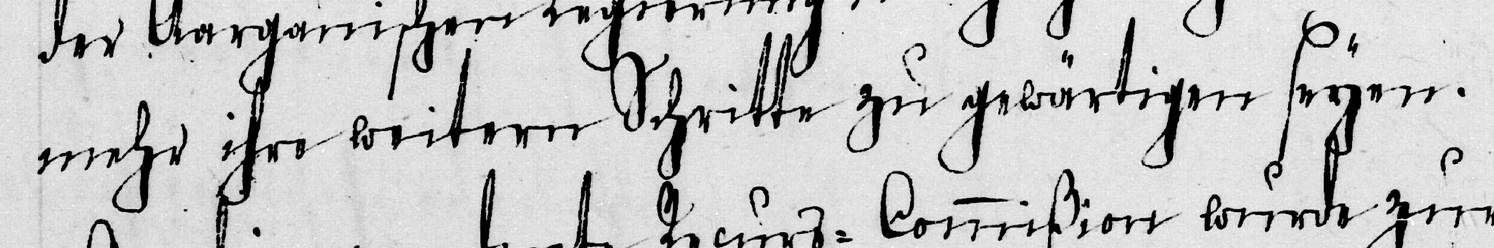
mehr ihre weitern Schritte zu gewärtigen seyen.
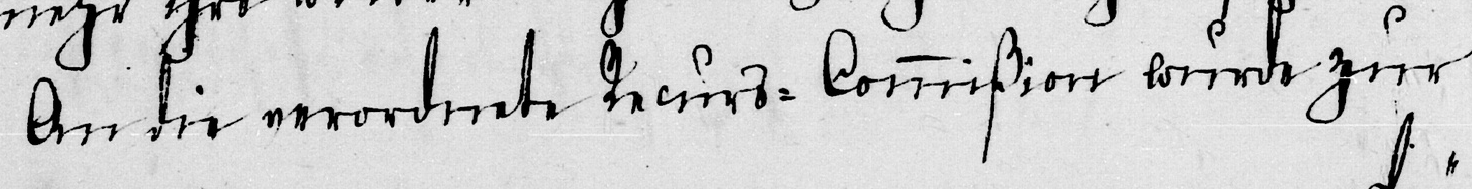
An die verordnete Recurs-Commißion wurde zur
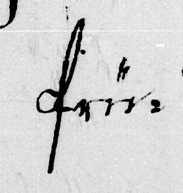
hal¬
